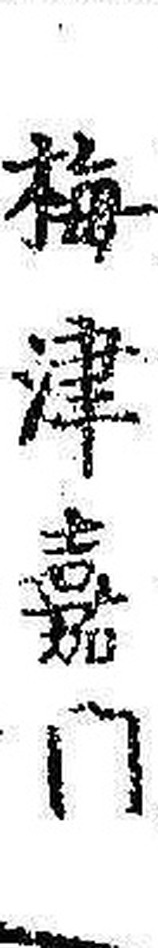梅津嘉門
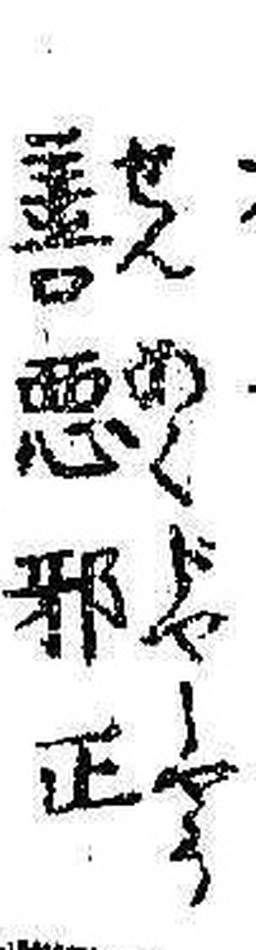善悪邪正
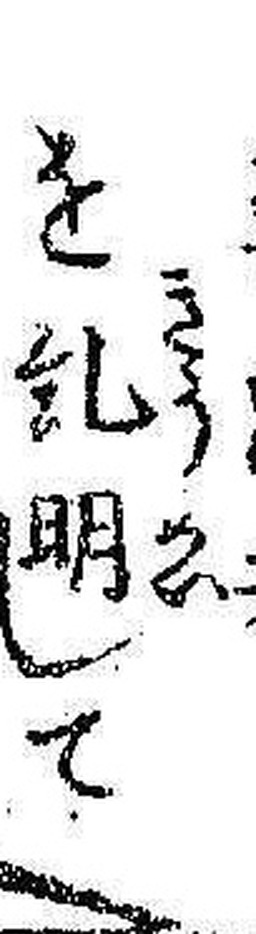を糺明して
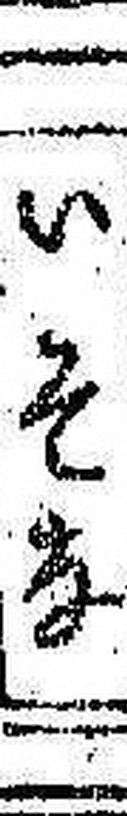いそな
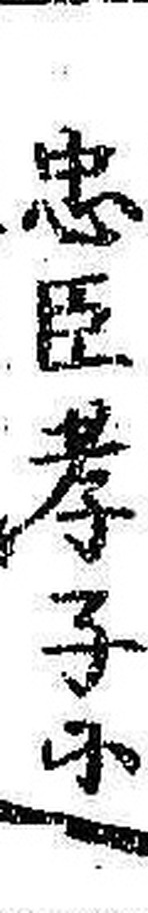忠臣孝子に
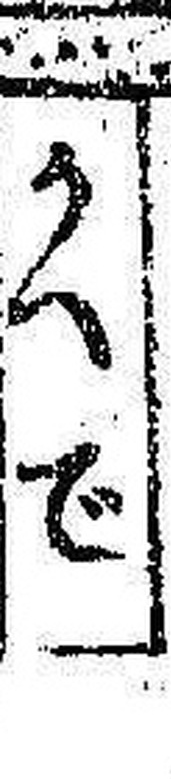かへで
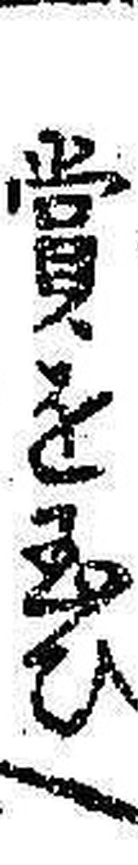賞を玉ひ
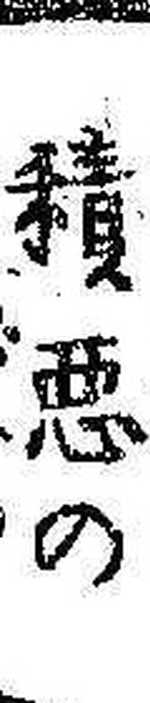積悪の
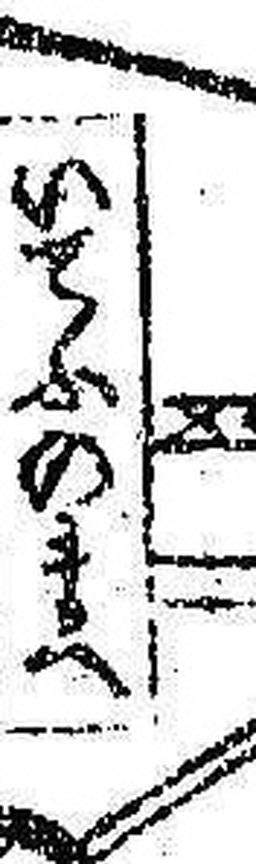いてふのまへ
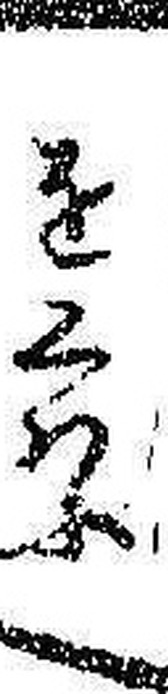をくわふ
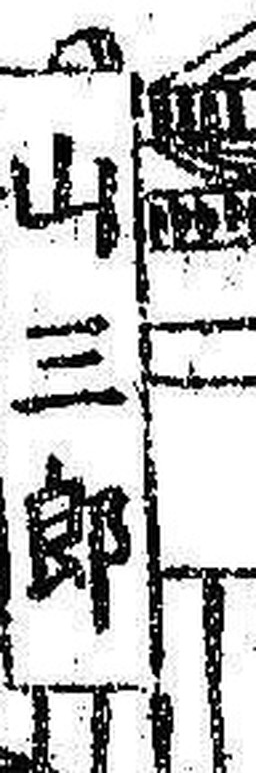山三郎
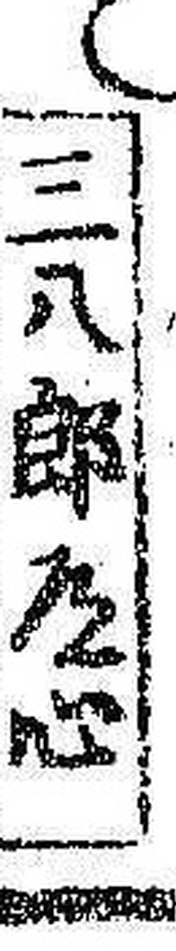三八郎道心
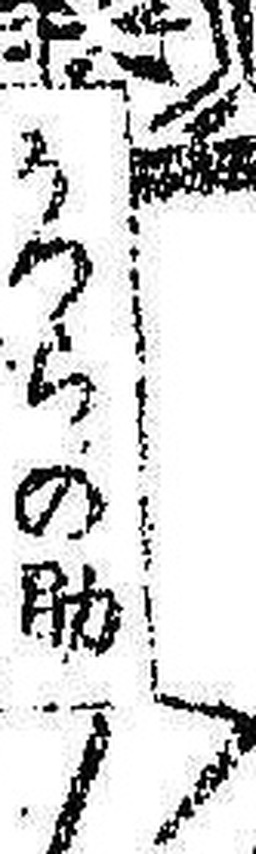かつらの助
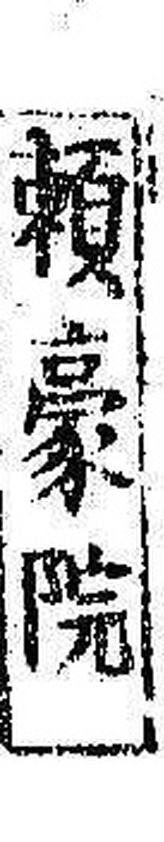頼豪院
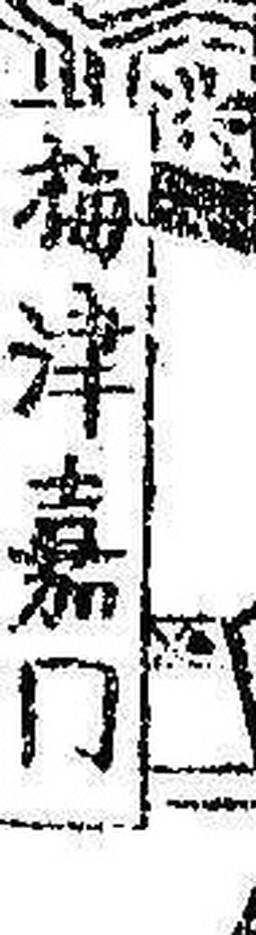梅津嘉門
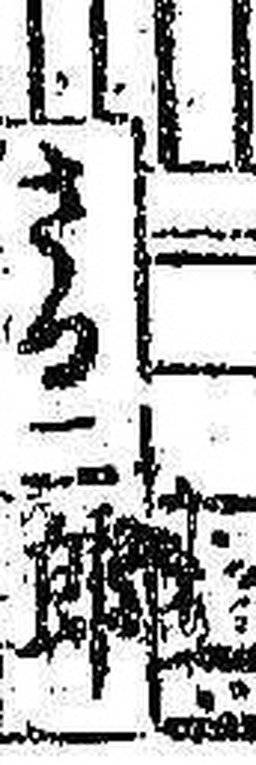さる二郎
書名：昔話稲妻表紙
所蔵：国文学研究資料館
